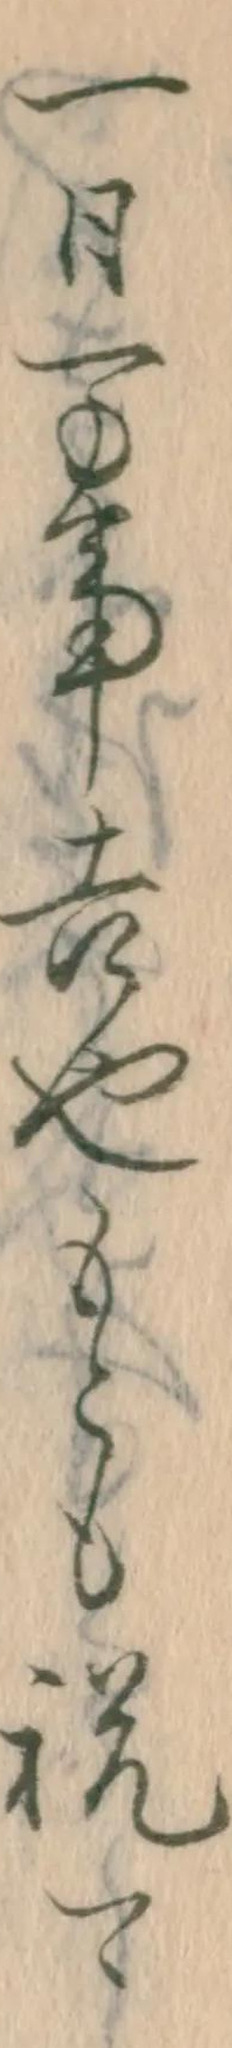一日万事吉也もとも祝
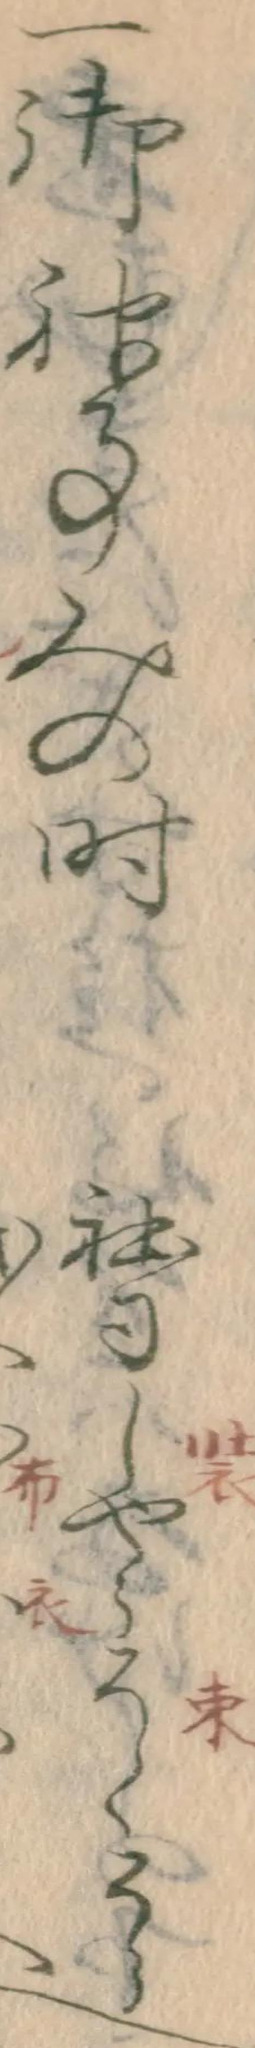一御神事みの時社司しやうそくそう
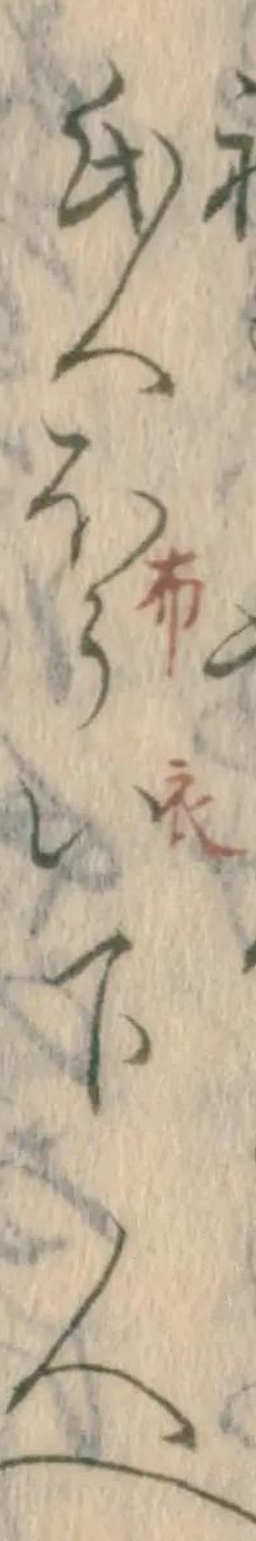氏人ほうい下人
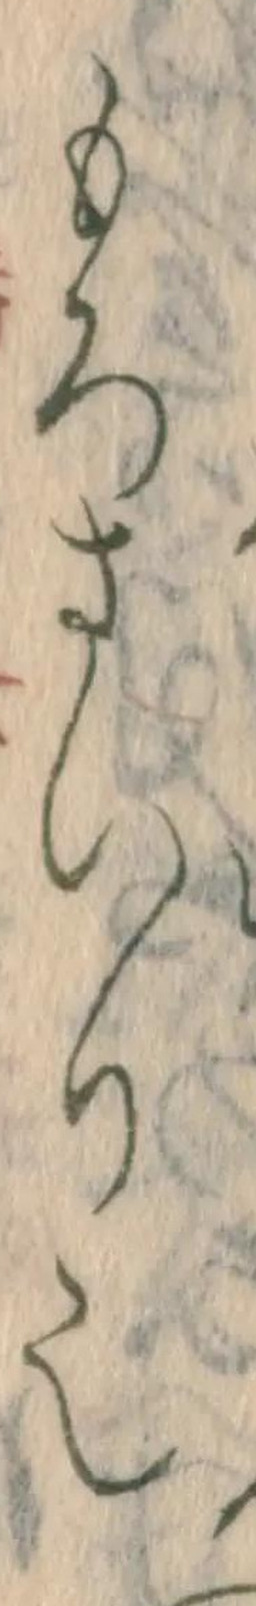もろまつり也
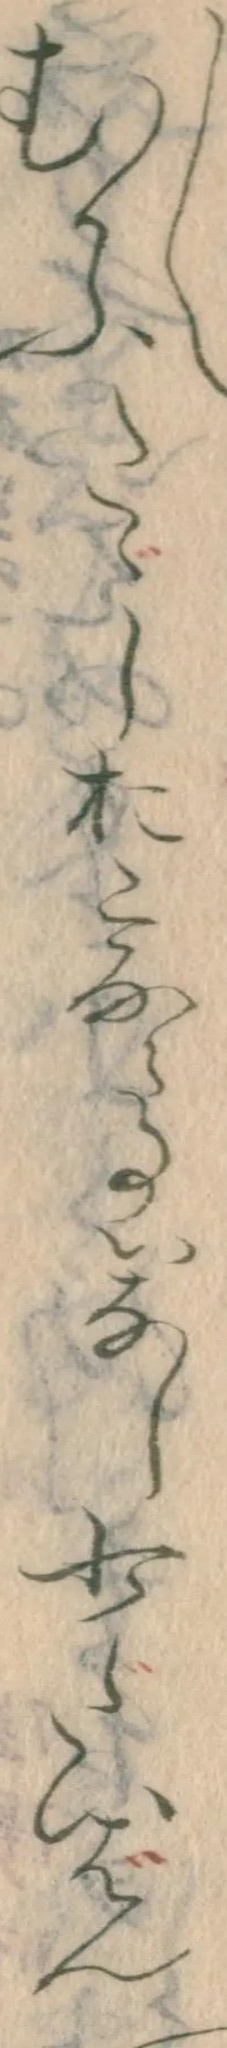むかふたゞしおこなる事いなし少だいばん
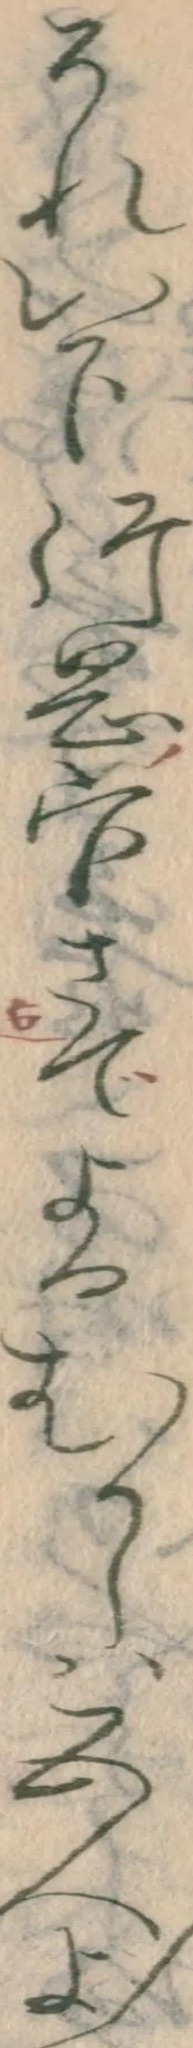それ以下片岡官までよるむかしは五人よ
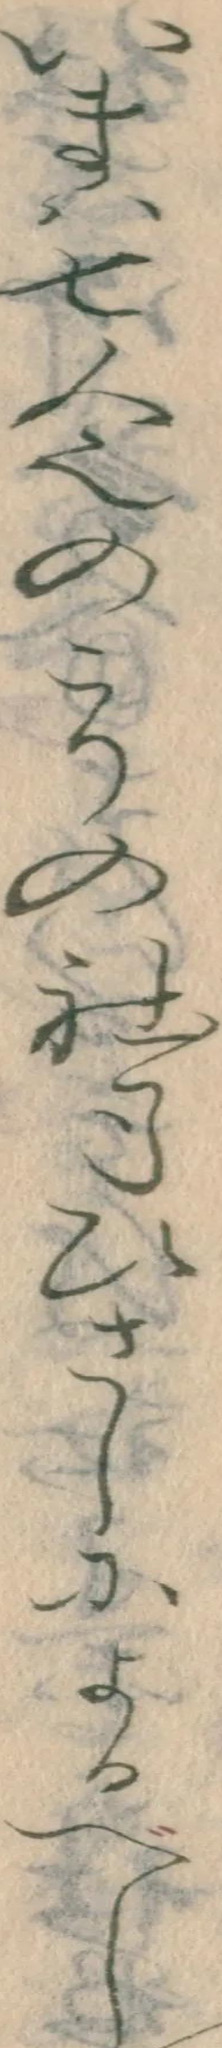いまは七人也のこりの社司ひさしによるべし
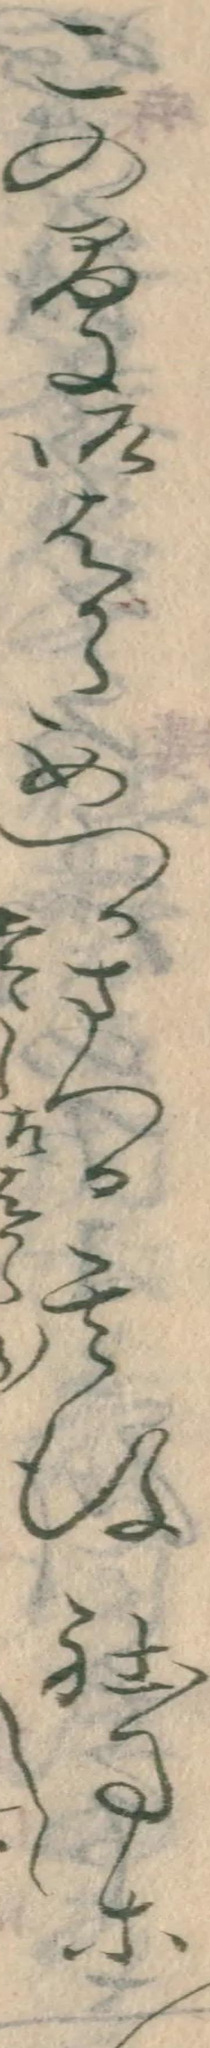この間に御はがためつかまつる其後社司等
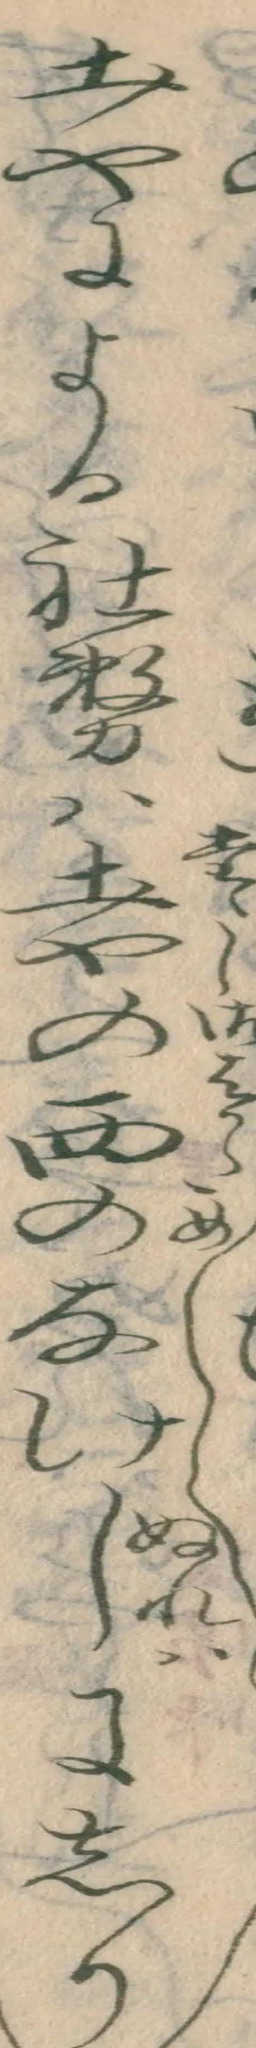土やによる社務は土やの西のなけしにしり
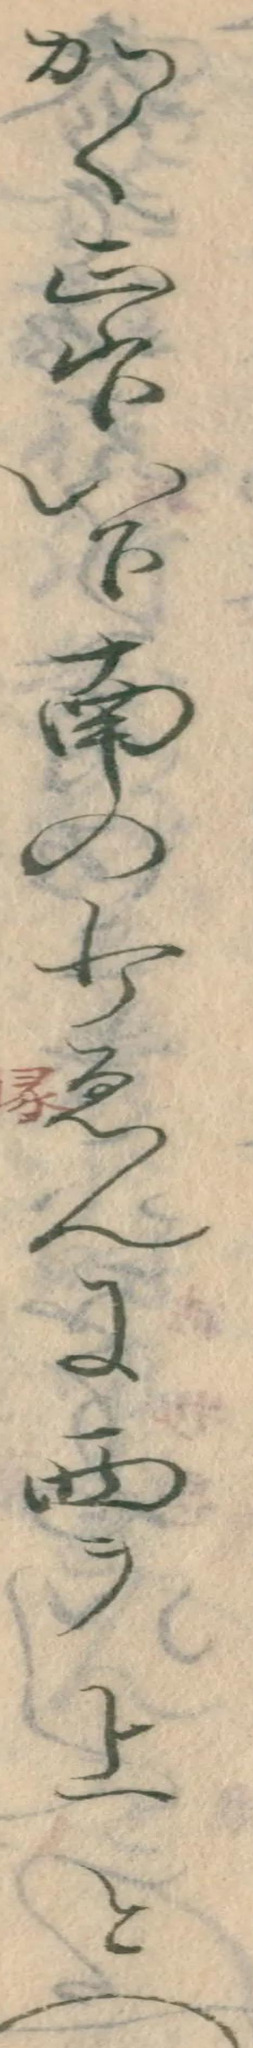かく正官以下南の少ゑんに西ヲ上と
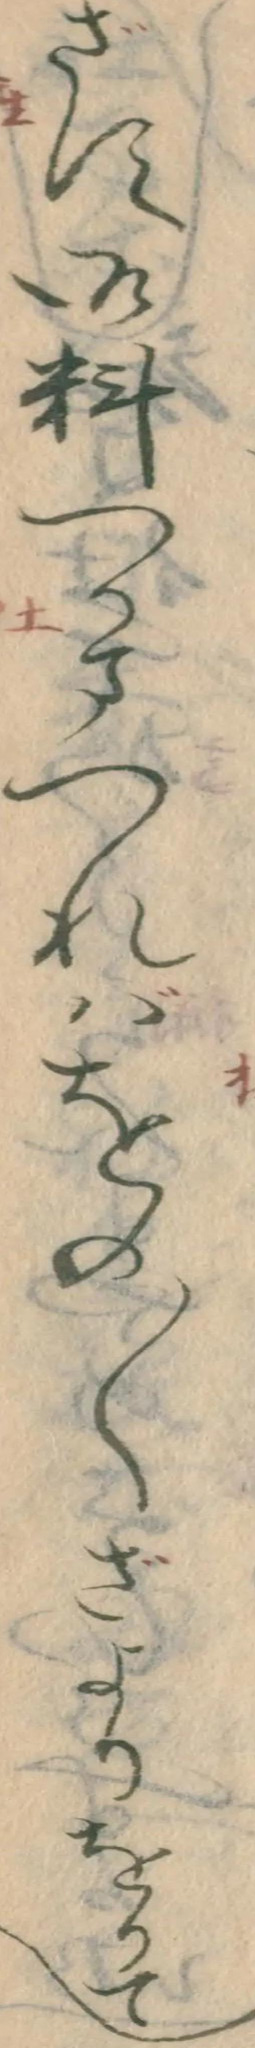ざす御料つかまつればをの〳〵ざよりをりて

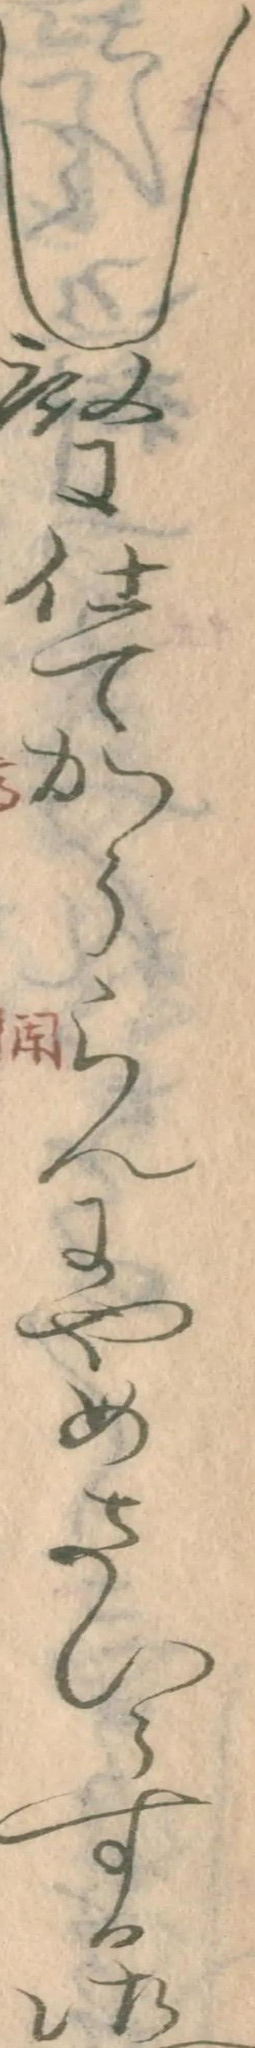殿に仕てかうらんにやめまいらする御
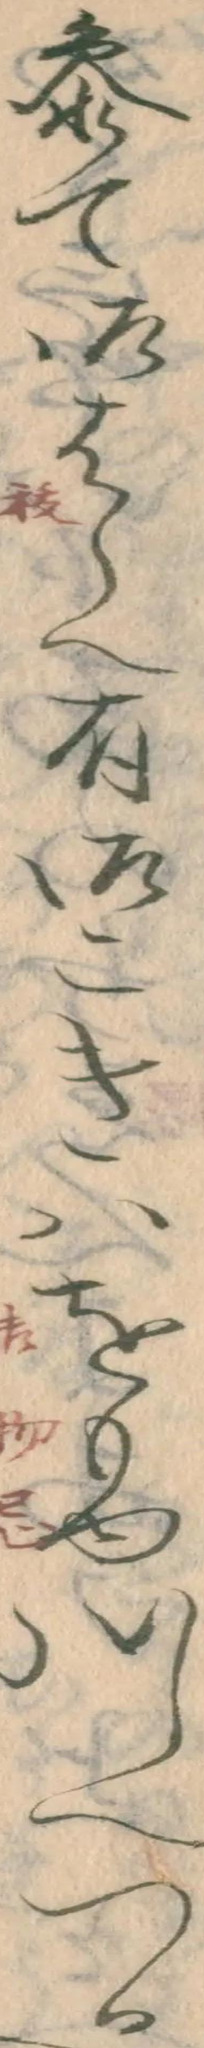参て御はらへ有御こきはをもゆ門へつる
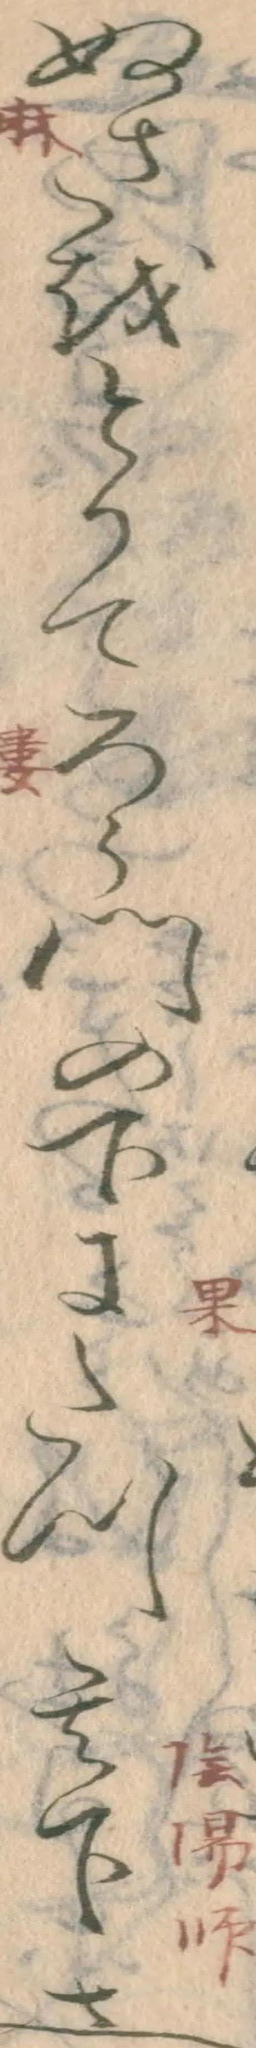ぬさをとりてろう門の下にたつ其下
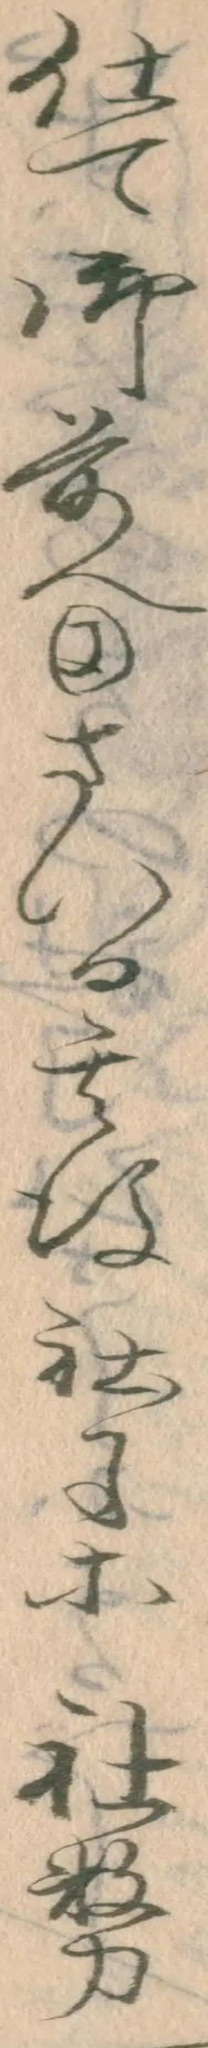仕て御前へまいる其後社司等社務
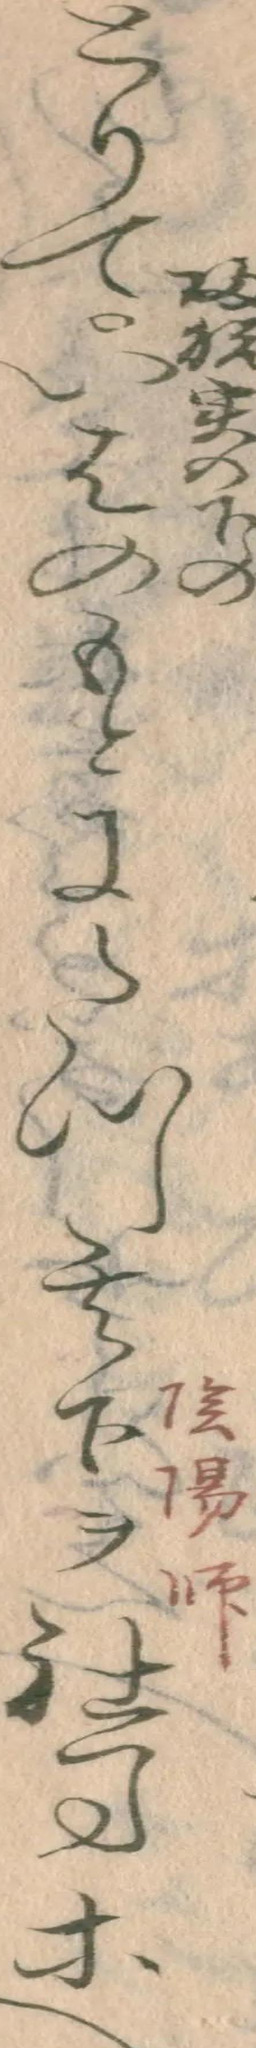とりて◦いはのもとにたつ其下を社司等
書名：賀茂社記録. 第3冊
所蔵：国立国会図書館 National Diet Library, JAPAN
